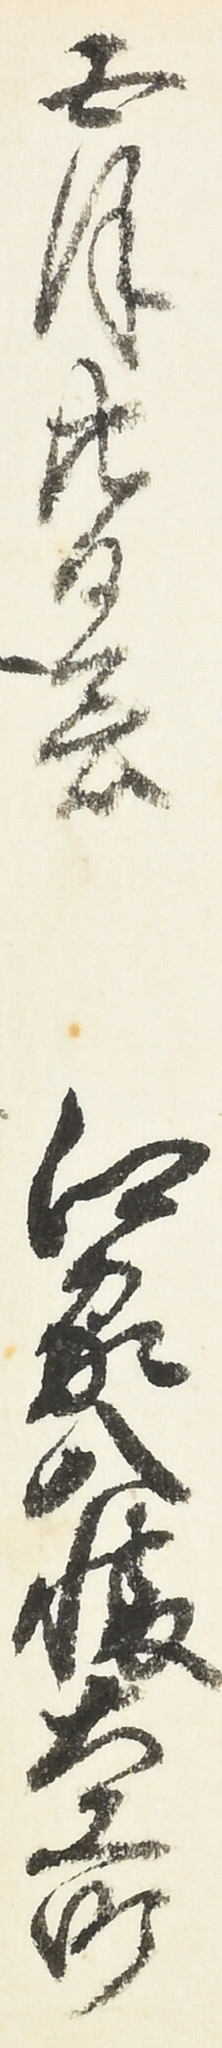五月廿日着江州八幡大工町
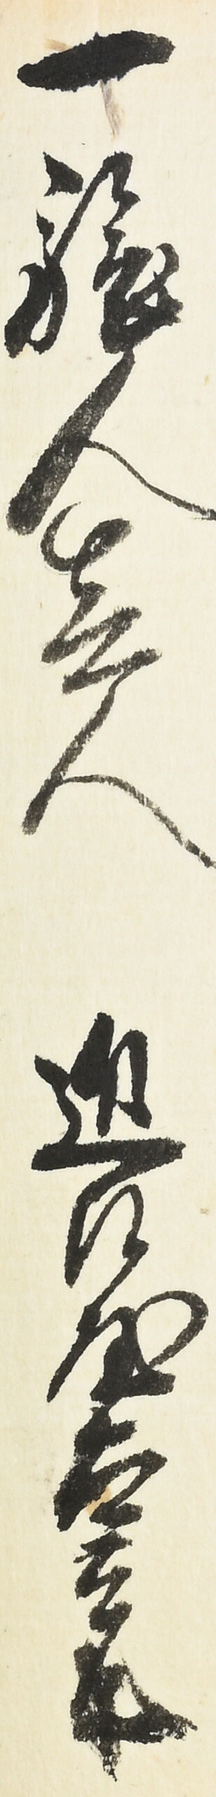一旅人壱人近江屋太兵衛
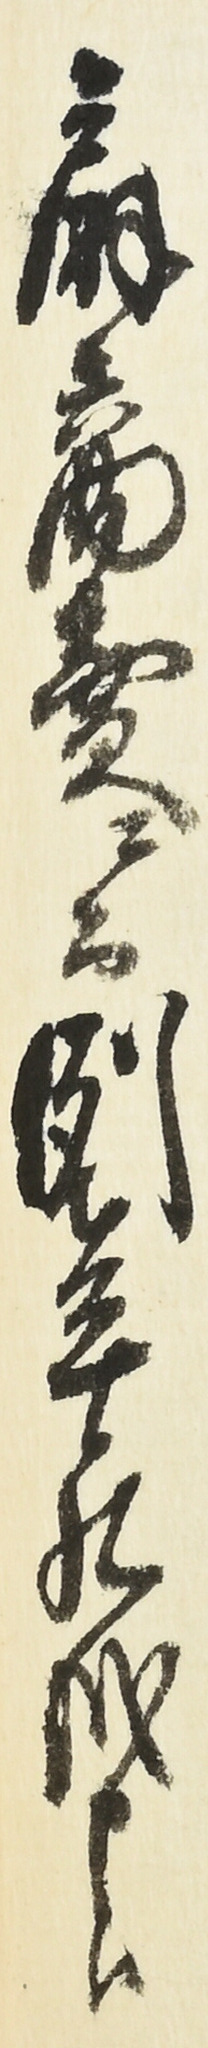扇商売ニ而例年罷越申候
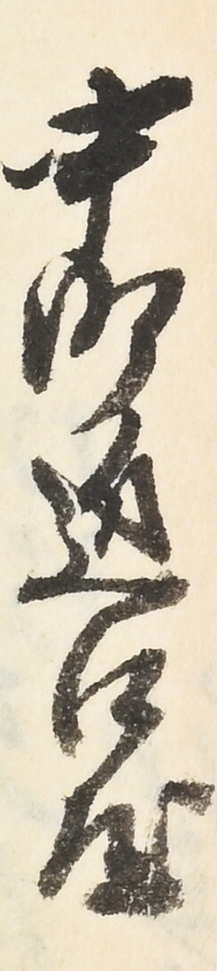中町近江屋

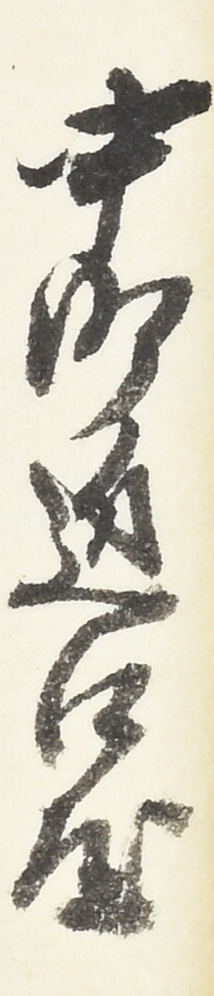中町近江屋
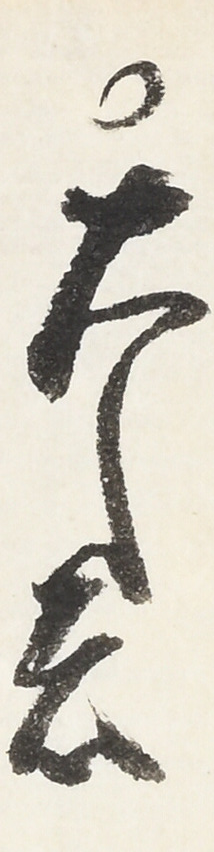〇右之者
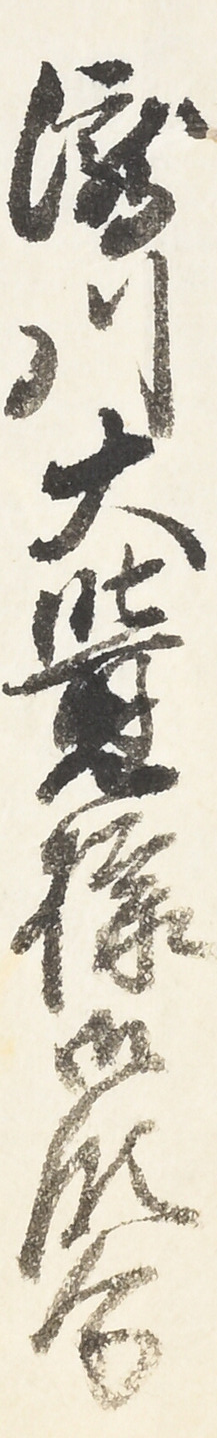瀧川大覚様御領分
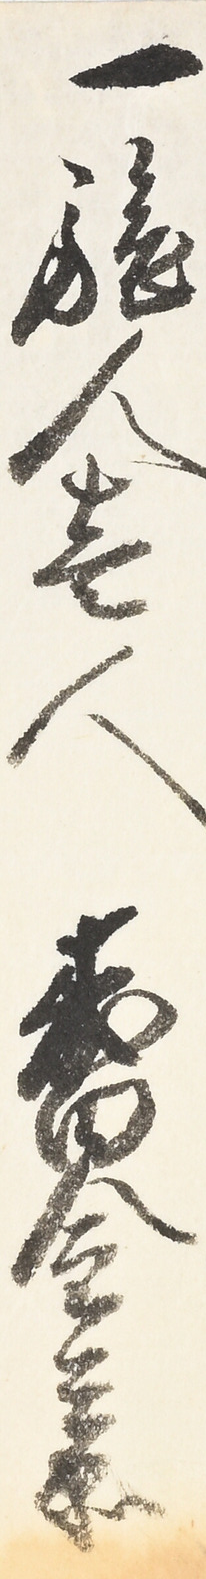一旅人壱人森田金兵衛
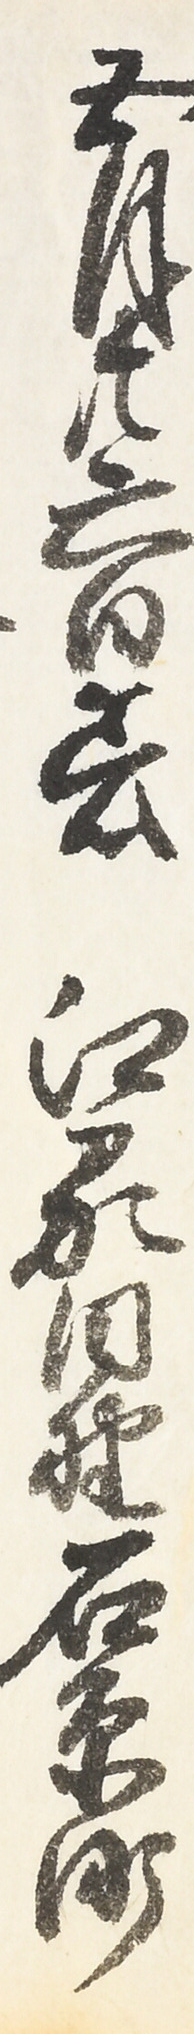五月廿六日着江州日野石原町
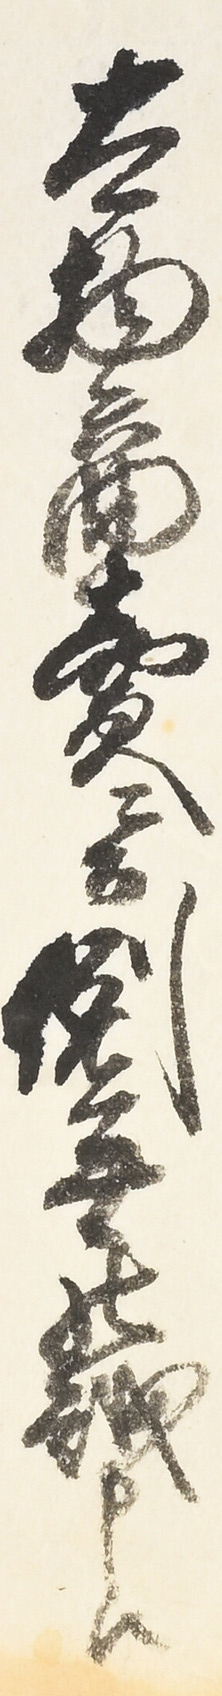太物商売ニ而例年罷越申候
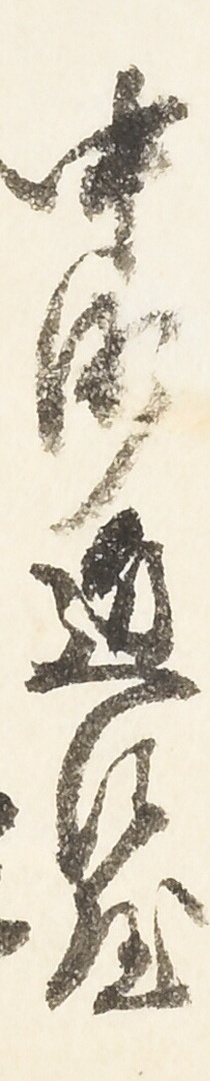中町近江屋
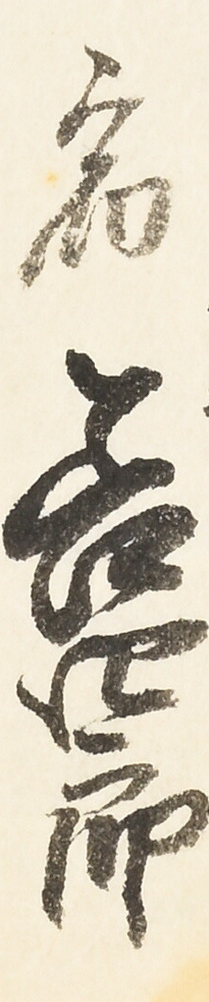宿善四郎
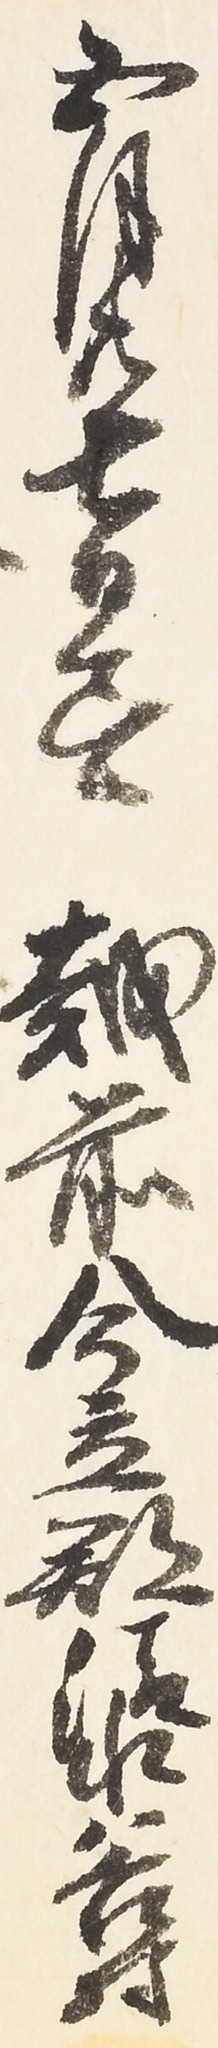五月七日着越前今立郡清水谷村
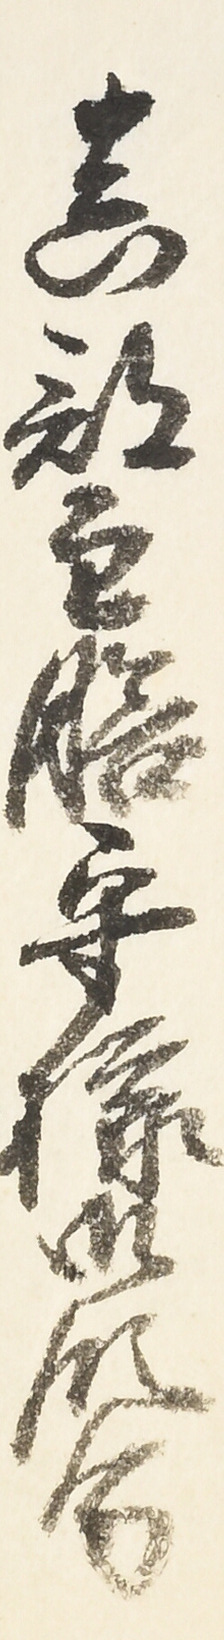真部主膳守様御領分
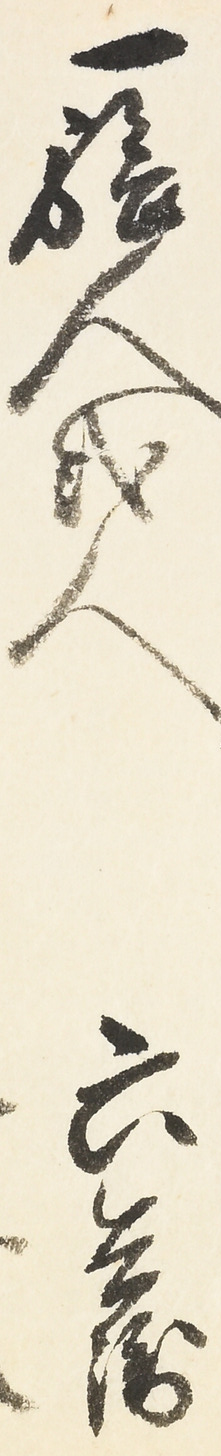一旅人弐人六兵衛
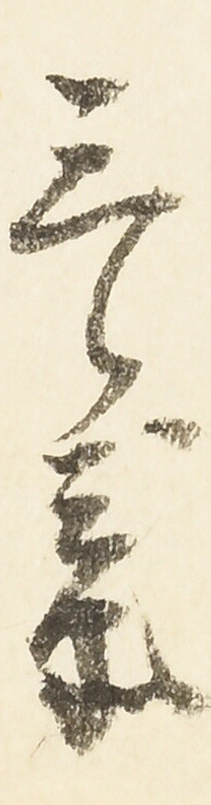三郎兵衛
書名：町中旅人泊控帳
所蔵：伊那市立高遠町図書館・合同会社AMANE
